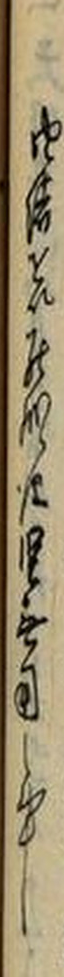由緒を以罷越候儀堅無用之事
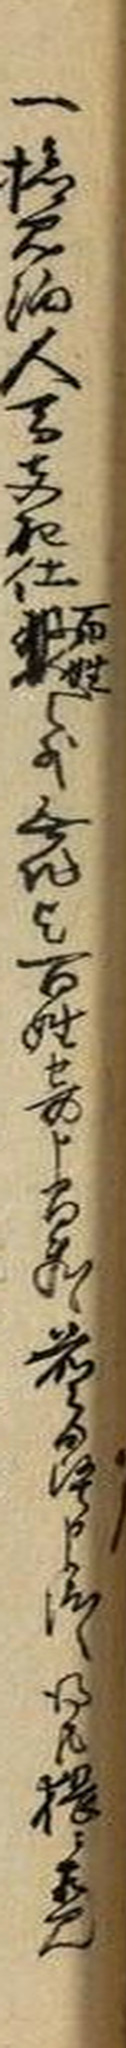一検見泊人馬支配仕百姓之外無作与百姓寄申間敷候前々ゟ堅申渡候得共猥ニ
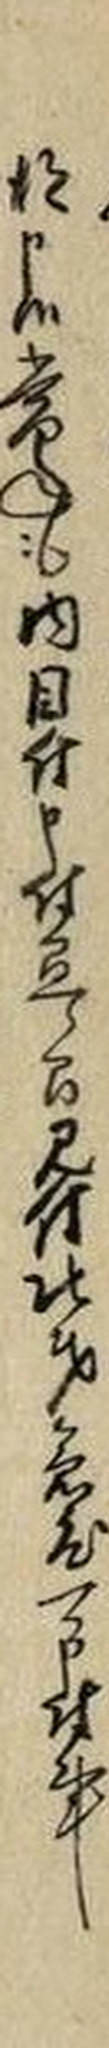相見得申候当年も内目付申付置候間見付次第急度可申付事
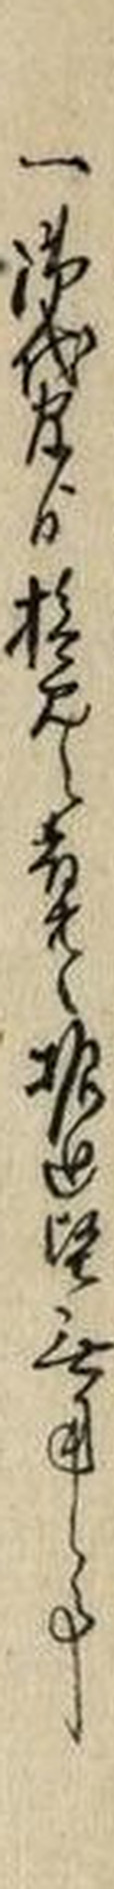一御代官ゟ検見之者共へ振廻堅無用之事
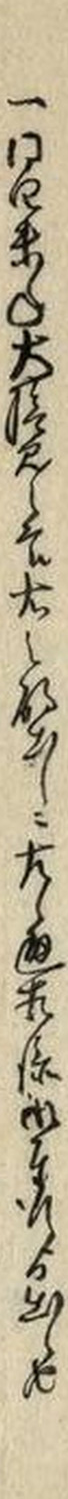一同四未年大検見之節右之触出しニ左之通相添御奉行ゟ出候由
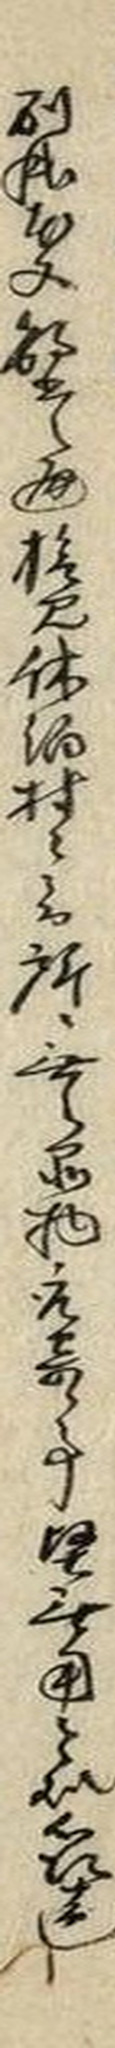別紙本文触書之通検見休泊村々ニ而所ニ無之品物取寄候事堅無用ニ候処心得違
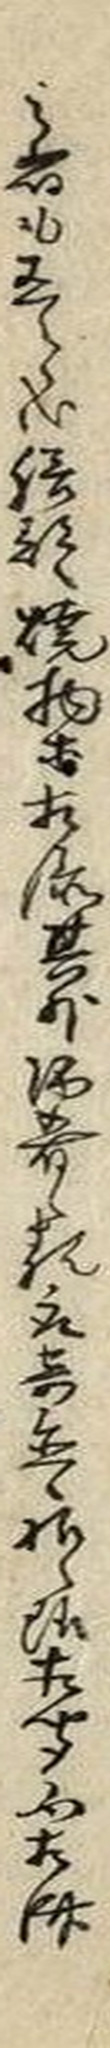之者も有之候哉膳部へ焼物等相添其外酒肴之類取寄置候様之趣相聞不相済
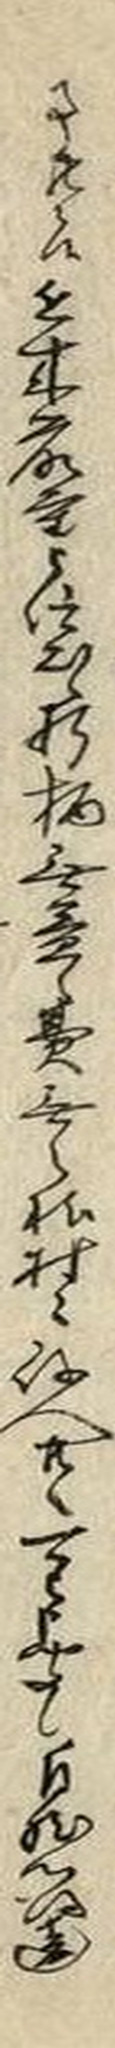事共ニ候近来厳重被仰出候折柄無益之費無之様村々役人共へ可被申聞候自然心得違
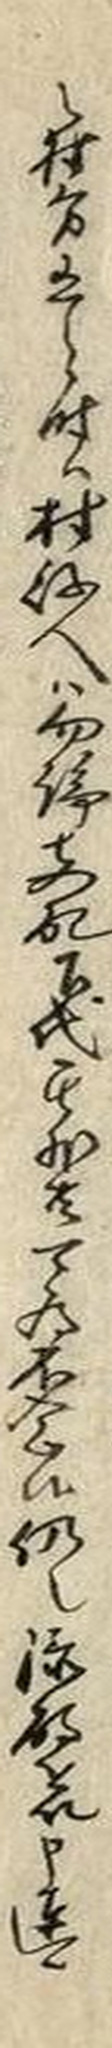之村方有之候時ハ村役人ハ勿論支配下代其外共可為不念候仍之添触を以申達候
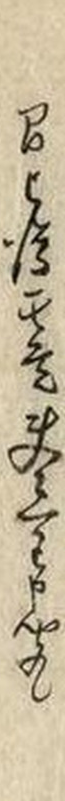間被得其意夫々可被申聞候
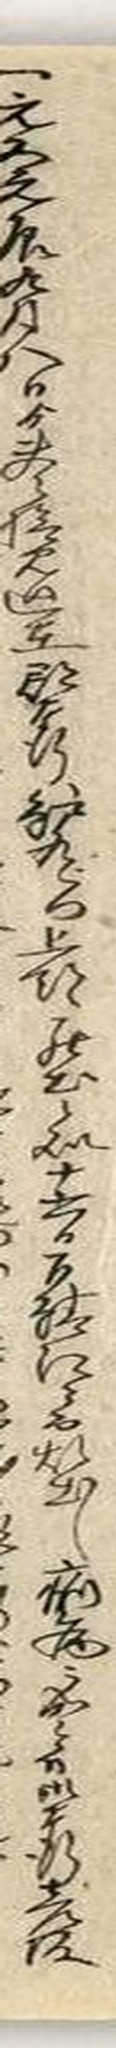一元文元辰九月八日ゟ夫々検見廻在郡奉行鱸九郎右衛門上領へ罷出候処十六日下鯖江ニ而煩出し痢病ニ成候ニ付御奉行彦坂
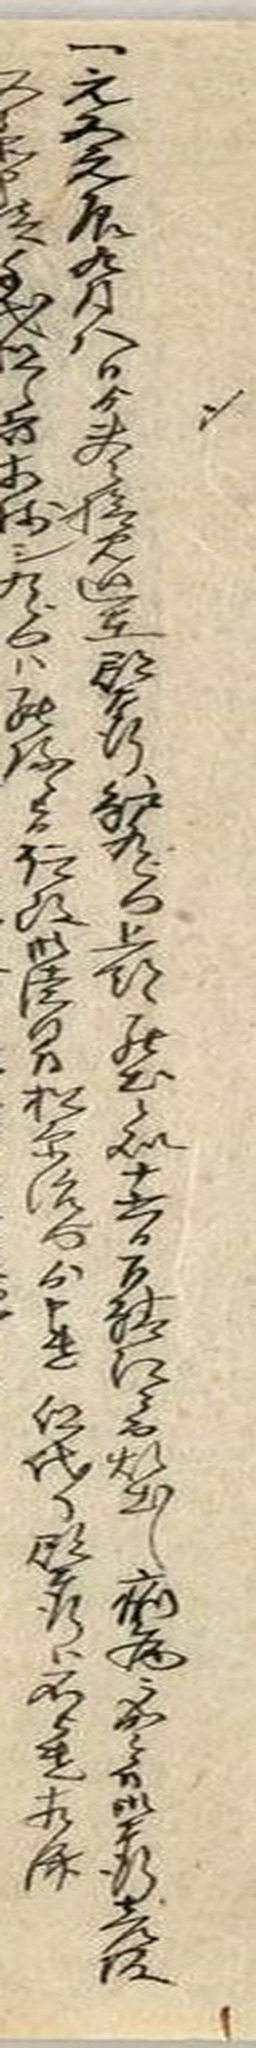又兵衛申談手代組之者相残シ九郎右衛門ハ罷帰候旨跡役御徒目付松原治右衛門ゟ申遣但代り郡奉行ハ不被遣相済
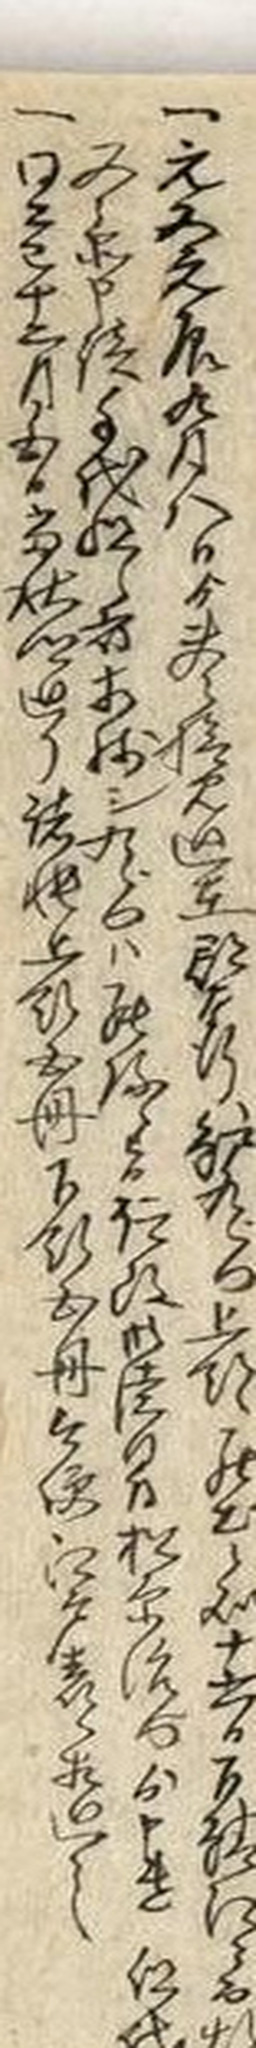一同二巳十二月五日当秋郷廻り諸帳上領五冊下領五冊今便江戸表へ相廻之

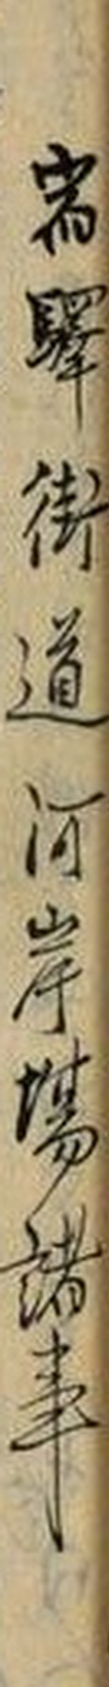宿駅街道河岸場諸事
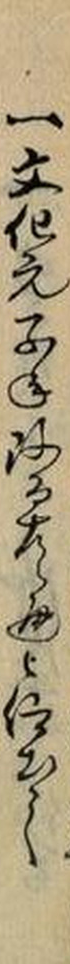一文化元子年改而左之通被仰出之
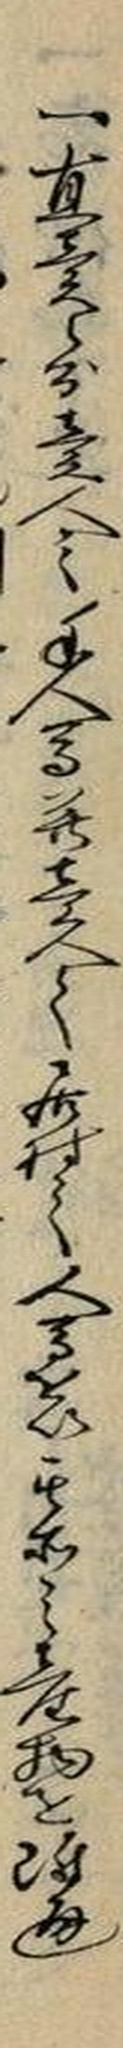一直売之分売人之手人馬幷売人之居村之人馬を以其所之産物を附通
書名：御国他国諸事之部
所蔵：福井県文書館 Fukui Prefectural Archives
